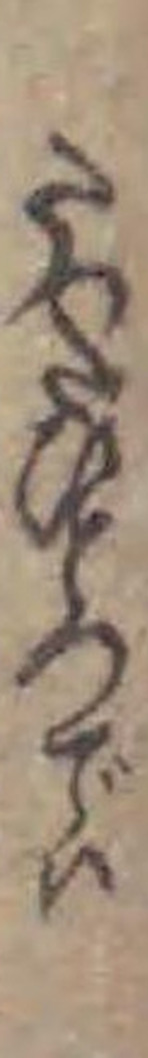たつたひとつでは
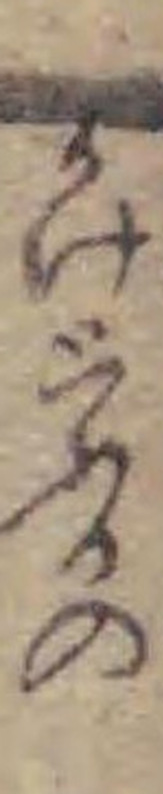かけとふりの
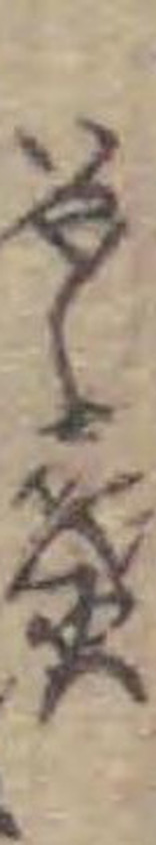いや〳〵には
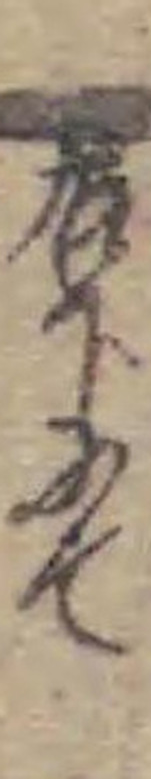店下にて
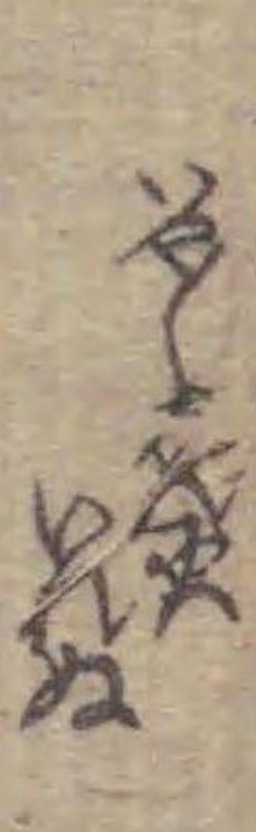いれぬ
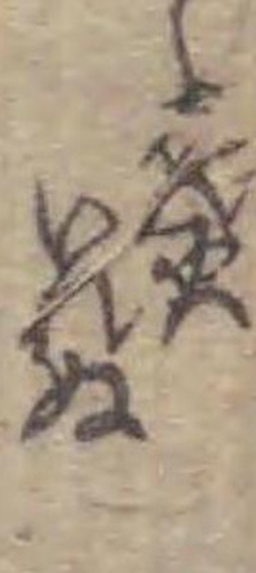いれぬ
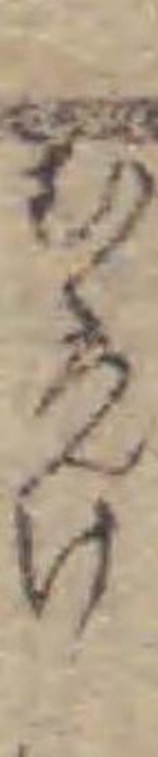むくろんけ
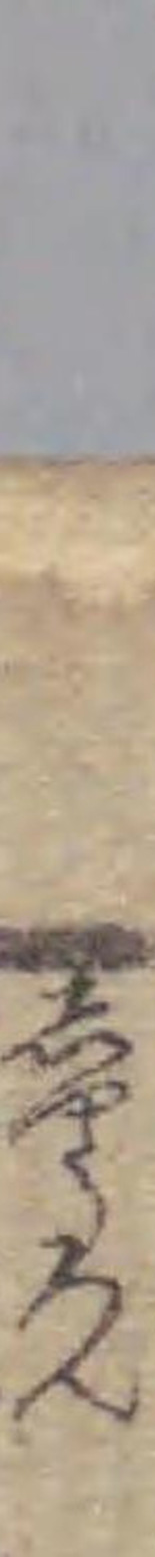しやうろん
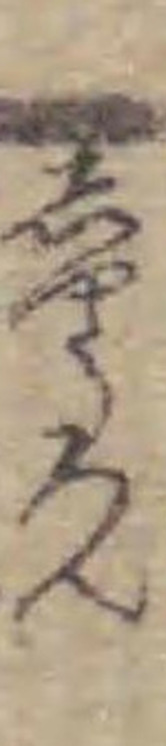しやうろん
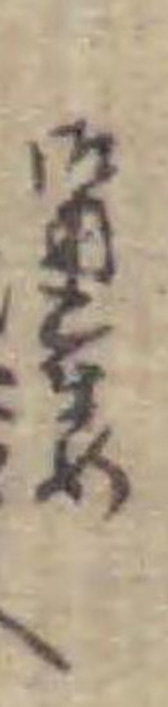御用ききめ
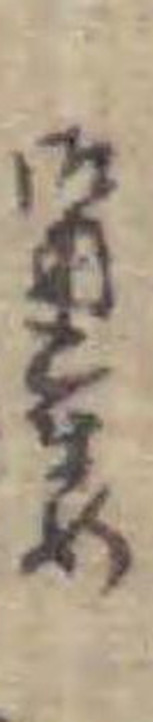御用ききめ
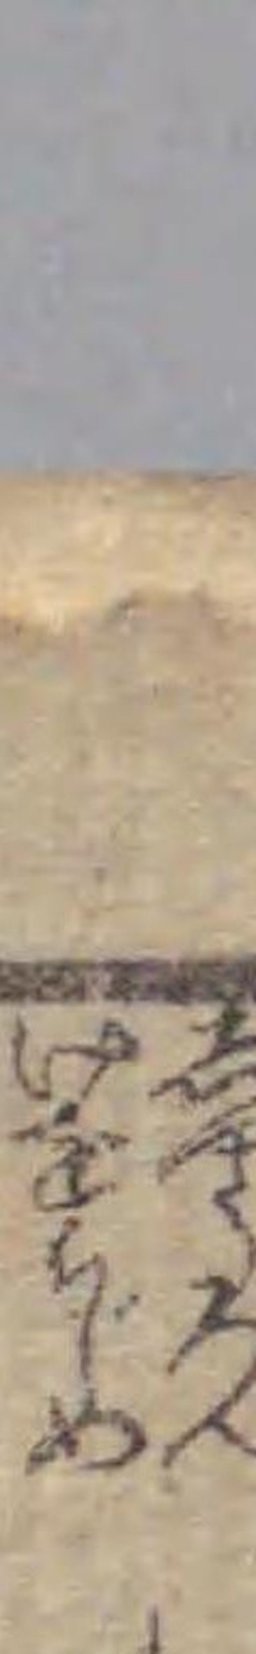けをはじめ
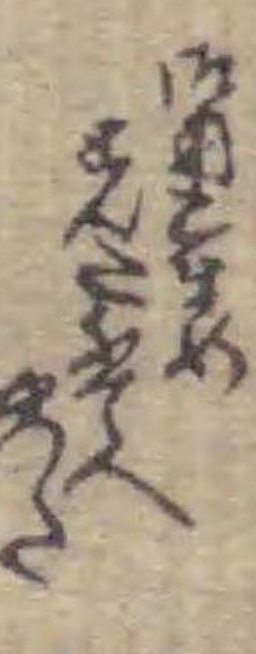とんたふてへ
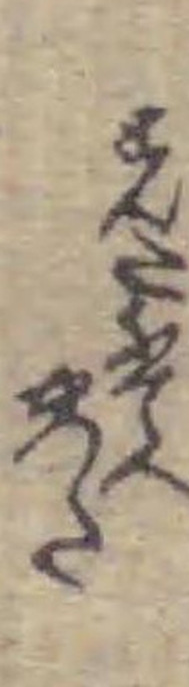やつた
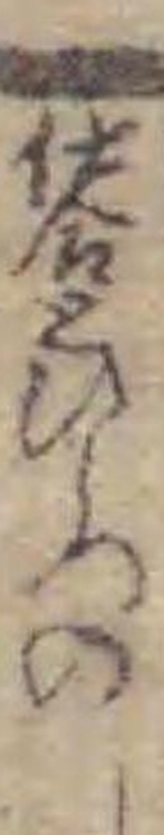仕合とひとつの
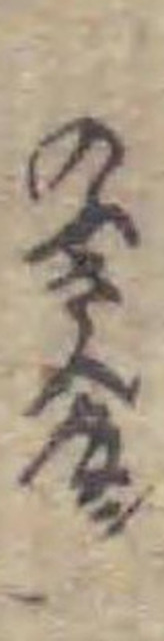のふさんたン
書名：通風伊勢物語 : 3巻
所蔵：国立国会図書館 National Diet Library, JAPAN
